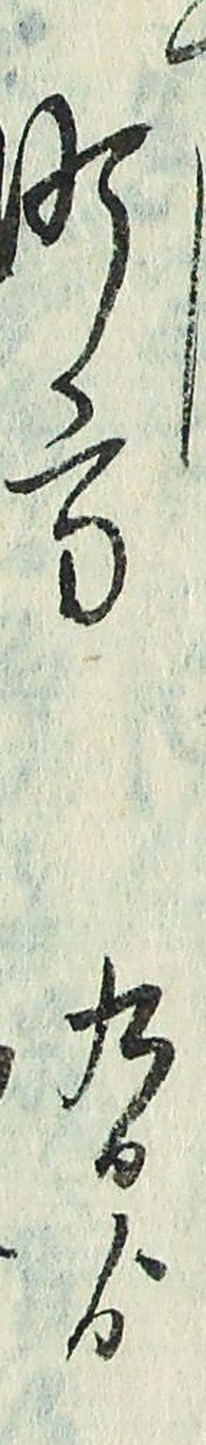町方九日ゟ
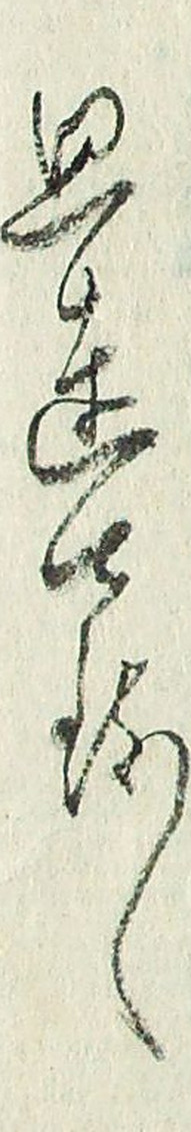廻達可致候

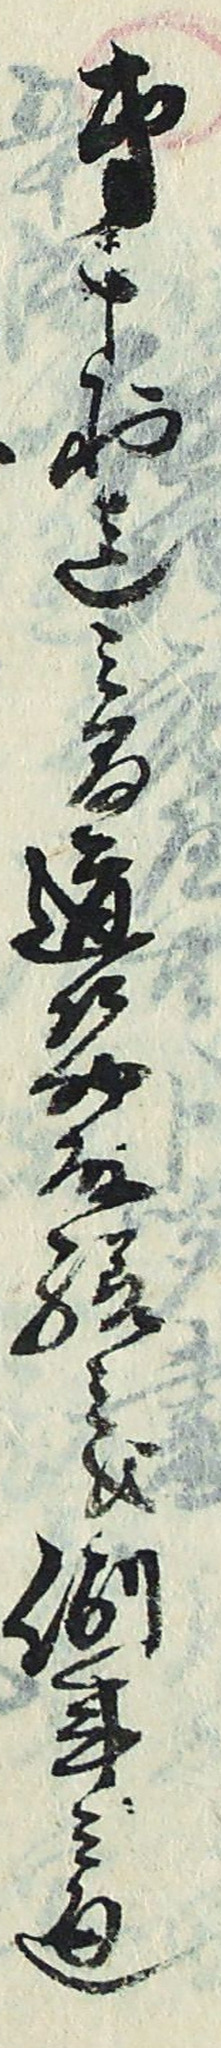第十村迄之間道筋取繕之義例年之通
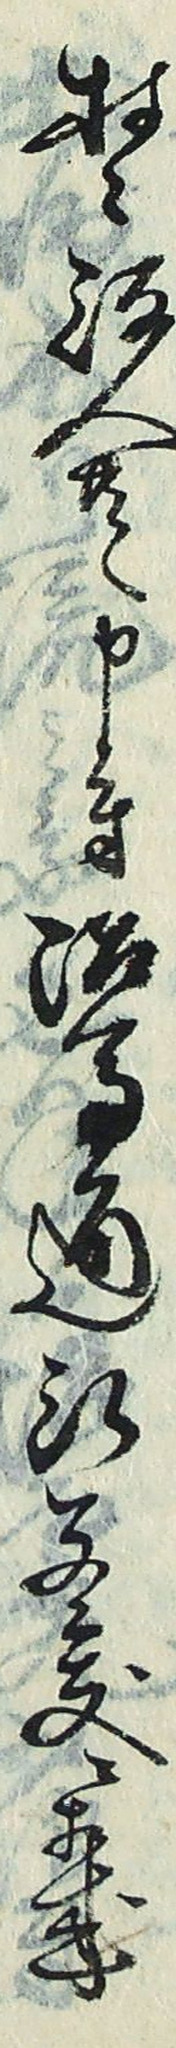村々役人共へ申付御馬通行差支ニ相成
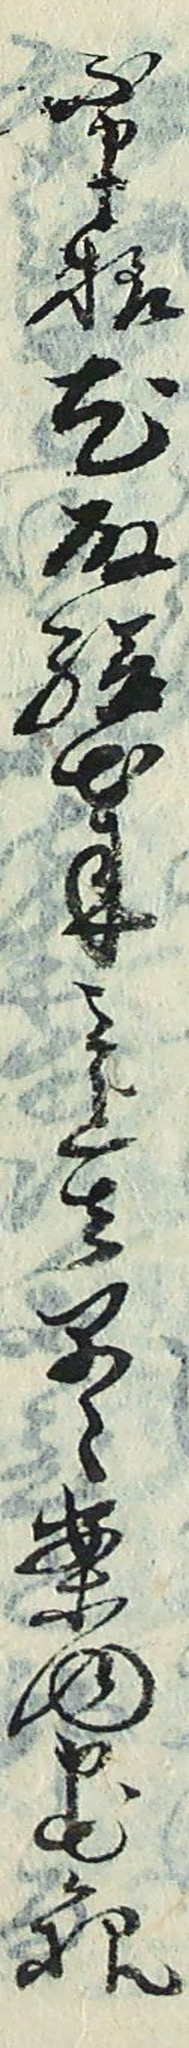不申様尤取繕出来之上者早々案内申出候様
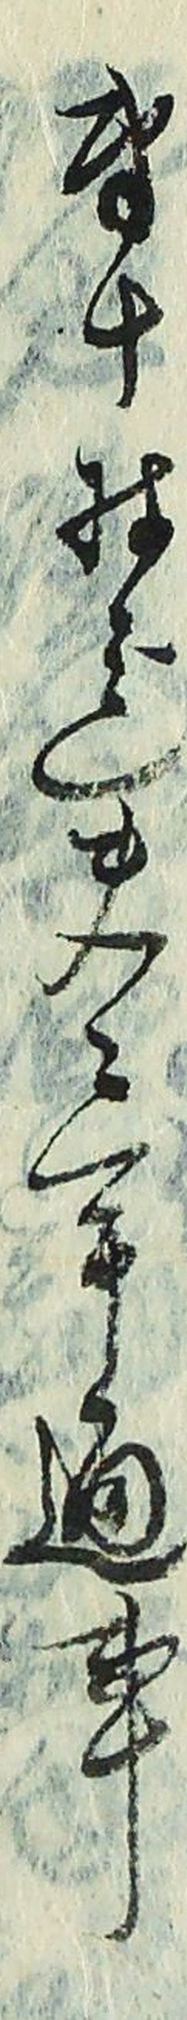第十村迄夫々可申通事
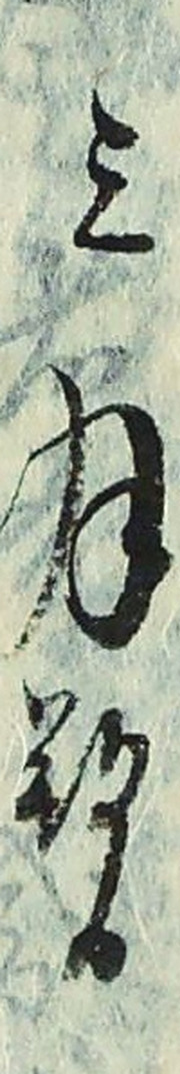三月朔日
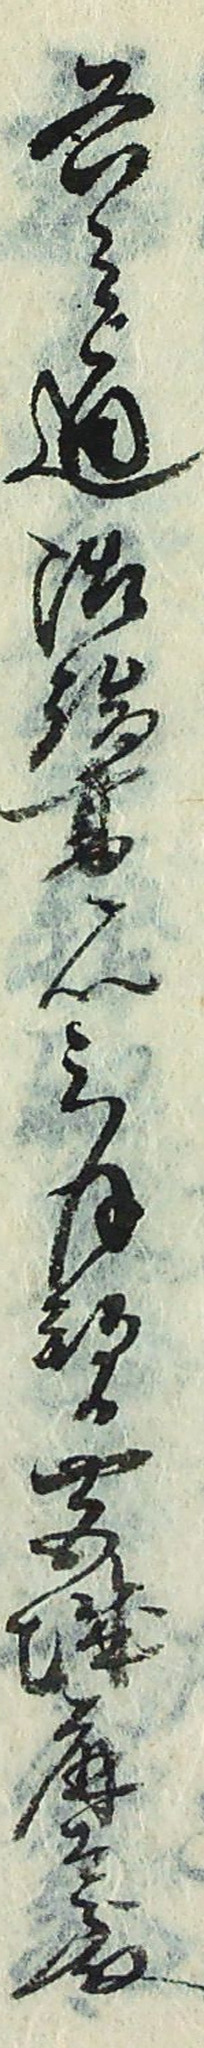右之通御端書ヲ以三月朔日宮城麻太郎殿
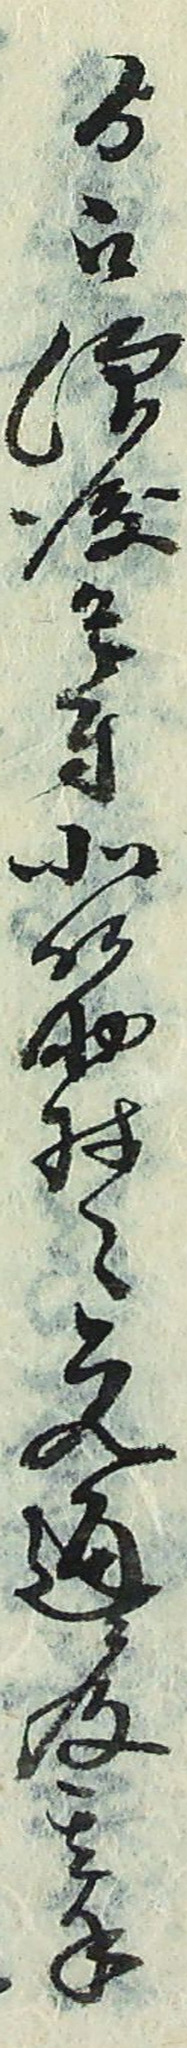ゟ被仰渡候ニ付北筋村々文通ニ及其年
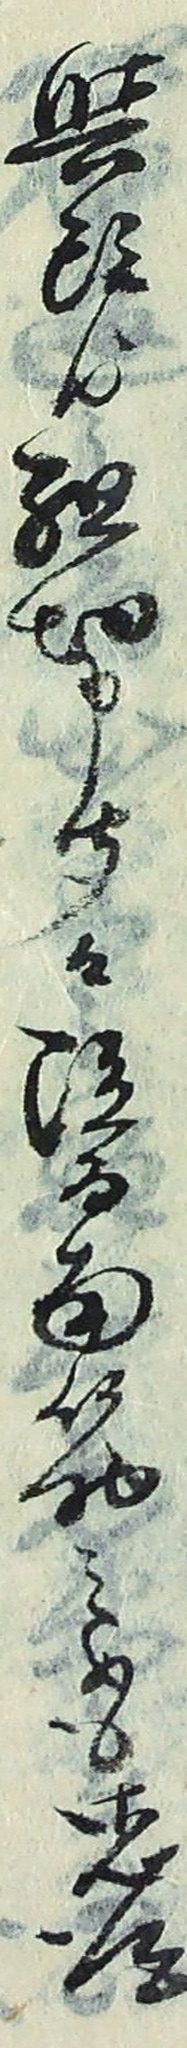與頭ゟ組切申聞候随而南筋之義も御心得
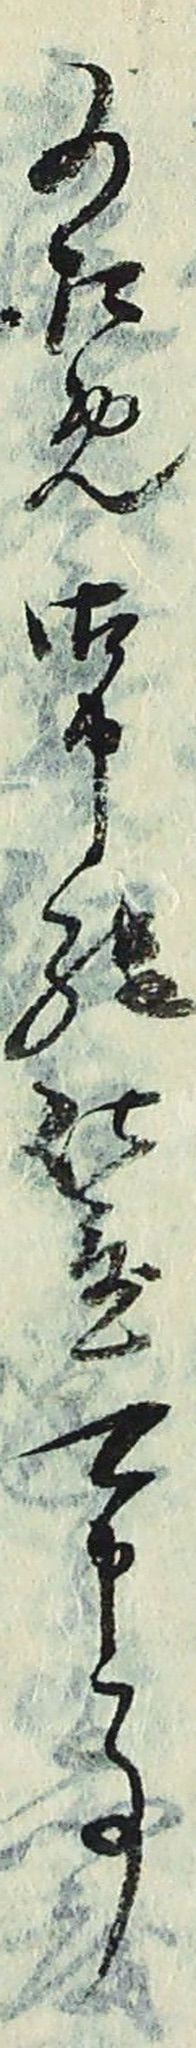のため御申継仕置可申事
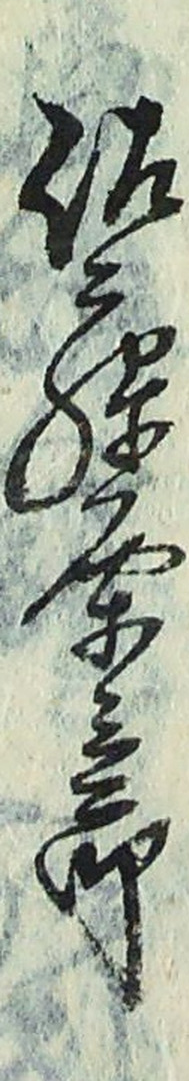佐藤粂三郎
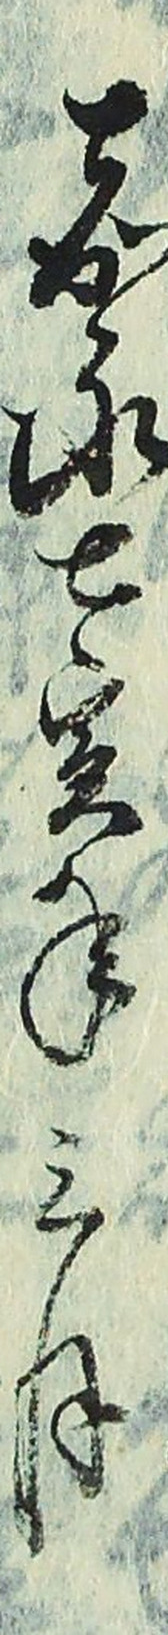嘉永七寅年三月

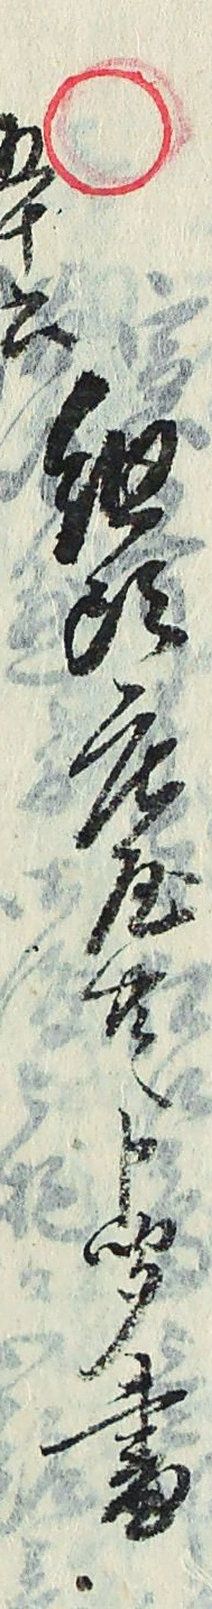○組頭庄屋共へ申聞書
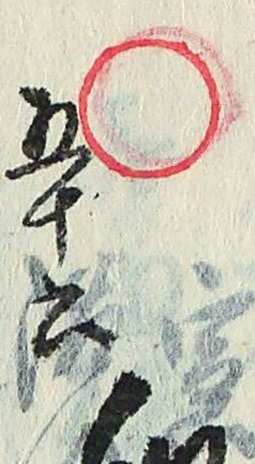五十六
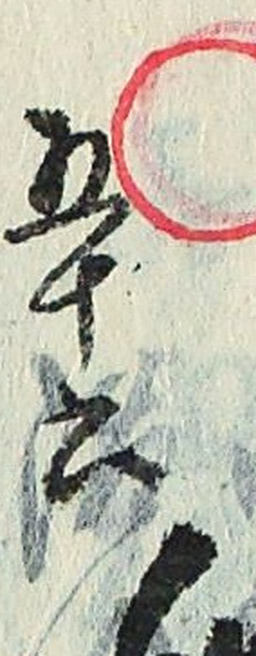五十六
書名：諸御趣意書并御下知向之写
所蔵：鳴門教育大学 Naruto University of Education
